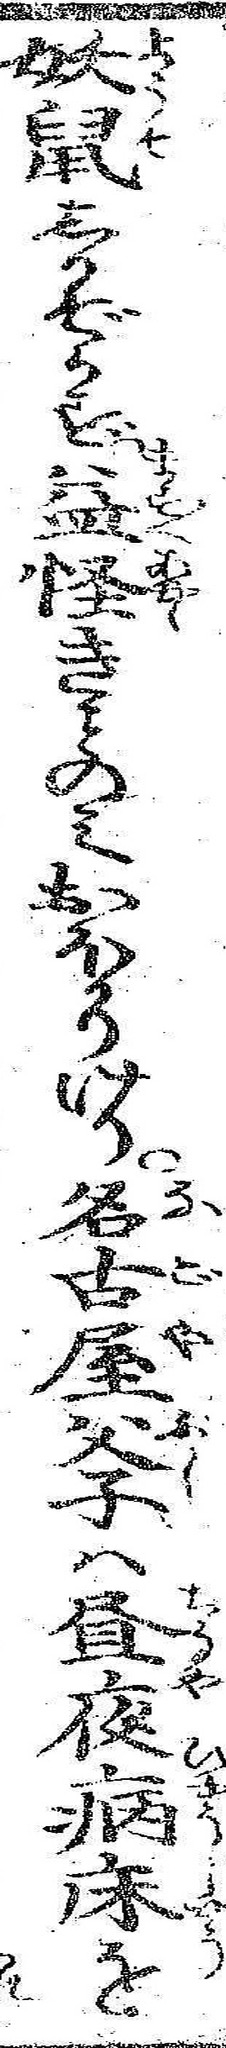妖鼠しりぞかず。益怪きことのみおほかりけり。名古屋父子は昼夜病床を
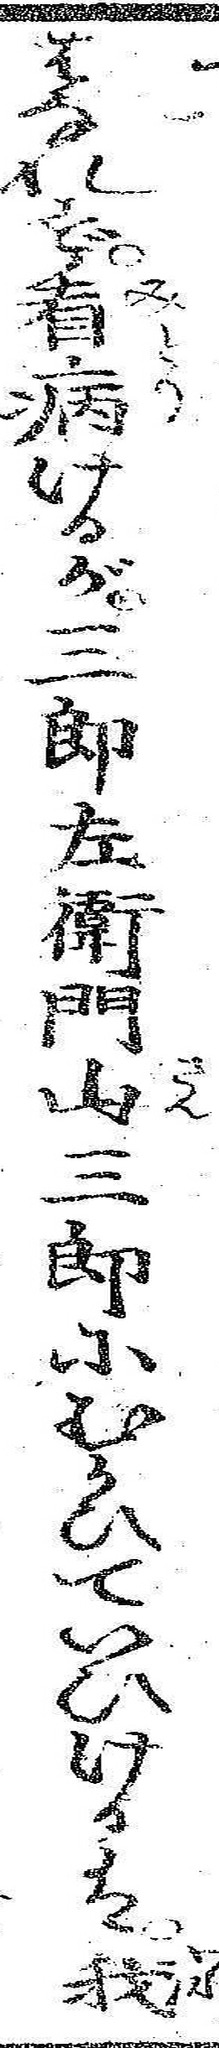はなれず。看病けるが。三郎左衛門山三郎にむかひていひけるは。我
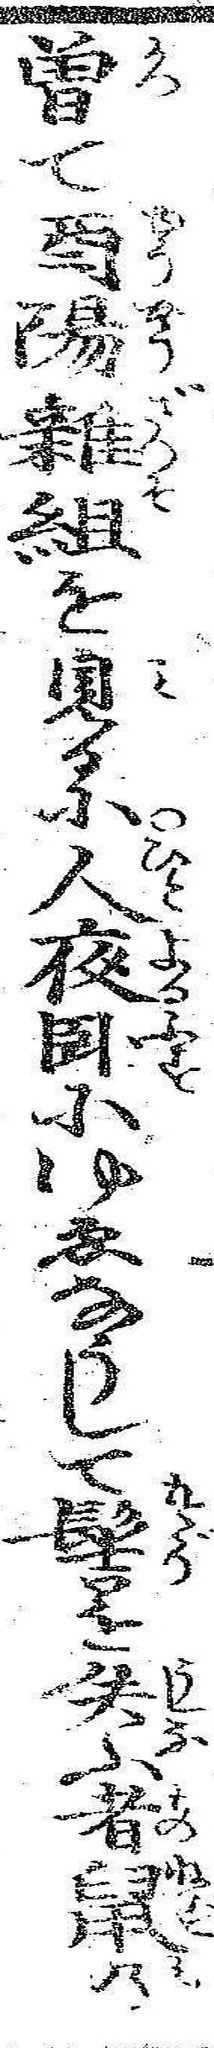曽て酉陽雑組を見るに。人夜臥にゆゑなうして髻を失ふ者鼠の
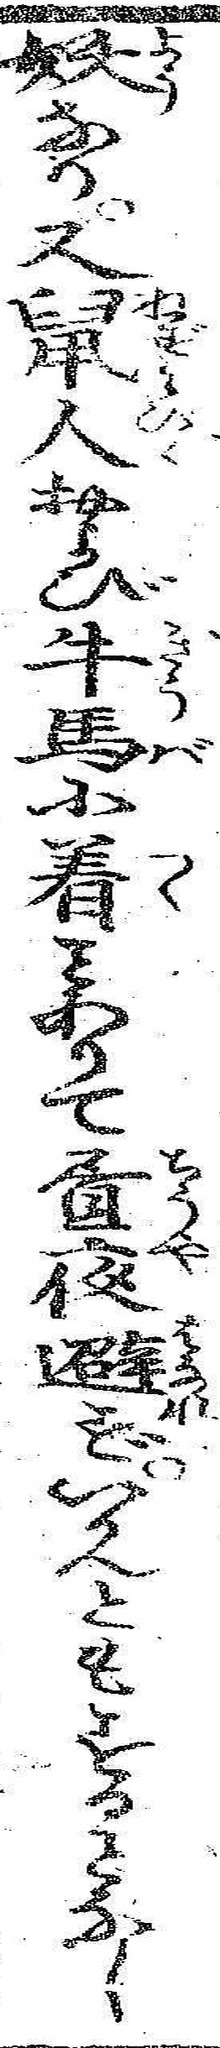妖なり。又鼠人および牛馬に着ことありて昼夜避ず。いかんともすることなし
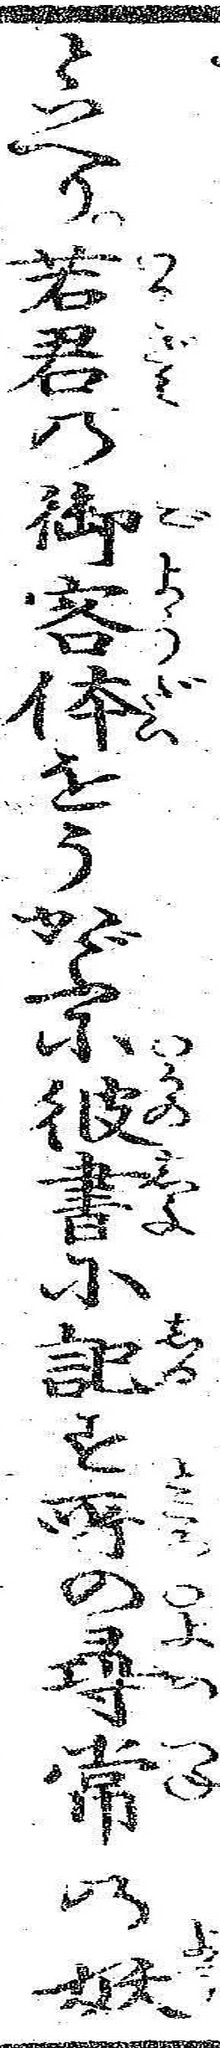といへり。若君の御客体をうかゞふに。彼書に記す所の。尋常の妖
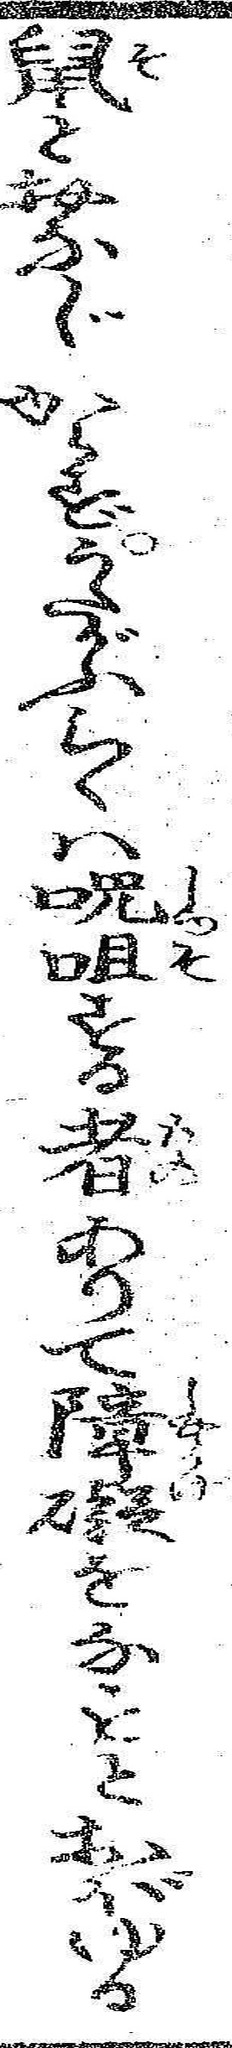鼠とおなじからず。うたがふらくは呪咀する者ありて障礙をなすとおぼゆる
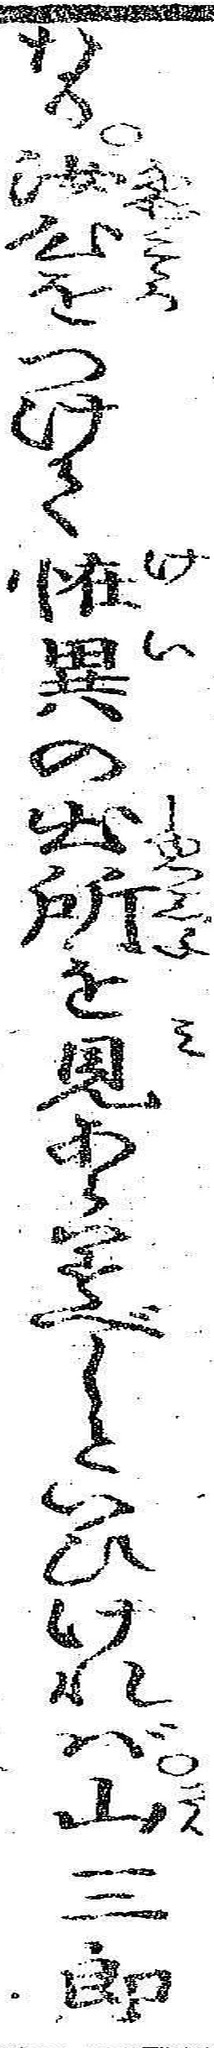なり。汝心をつけて怪異の出所を見あらはすべしといひければ。山三郎
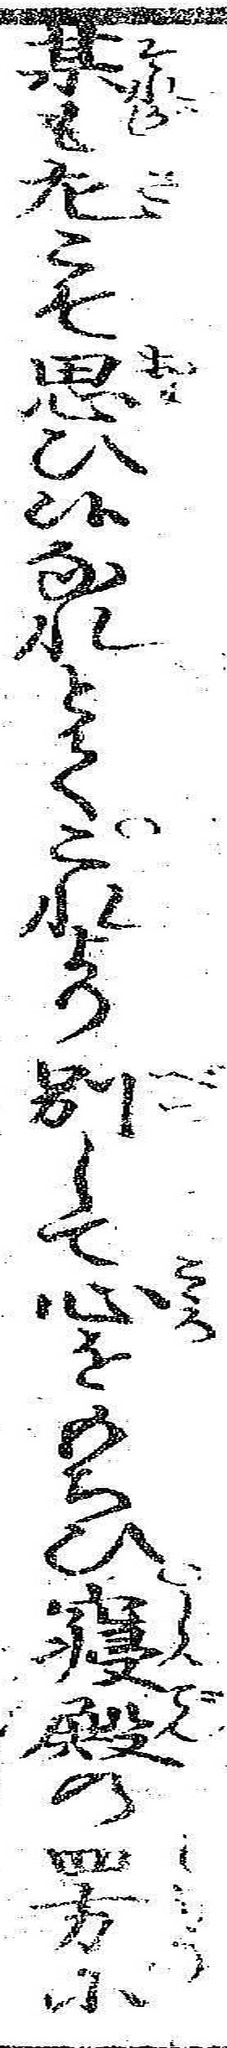某も左こそ思ひ候なれとて。これより別して心をもちひ。寝殿の四方に
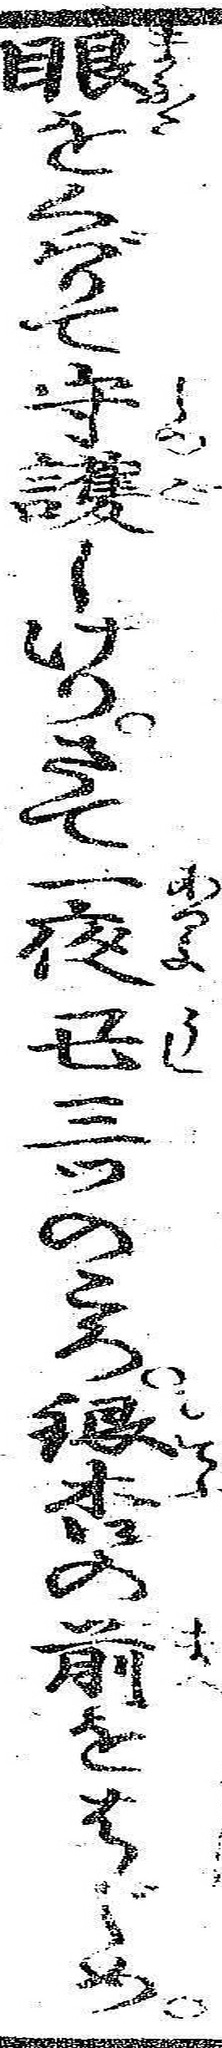眼をくばりて守護しけり。さて一夜丑三ツのころ。銀杏の前をはじめ。
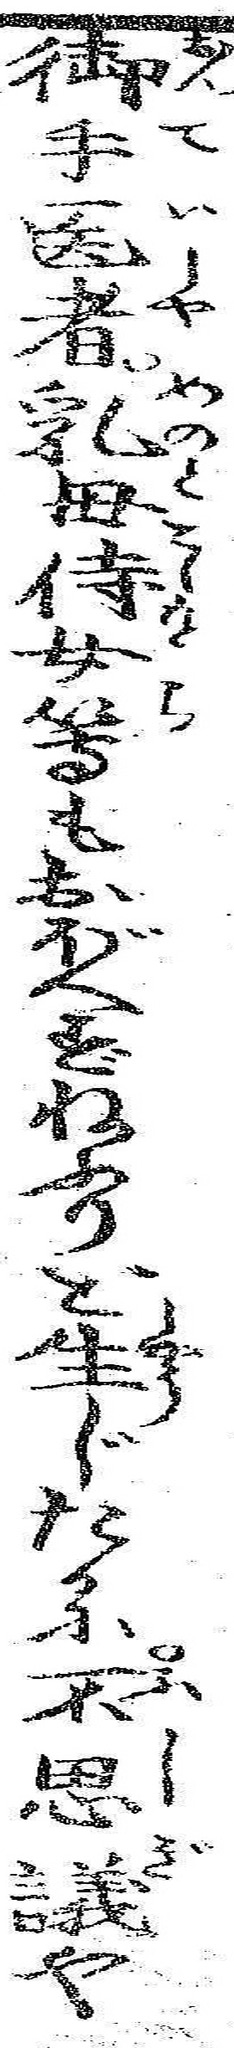御手医者。乳母侍女等もおぼへずねふりを生じたるに。不思議や
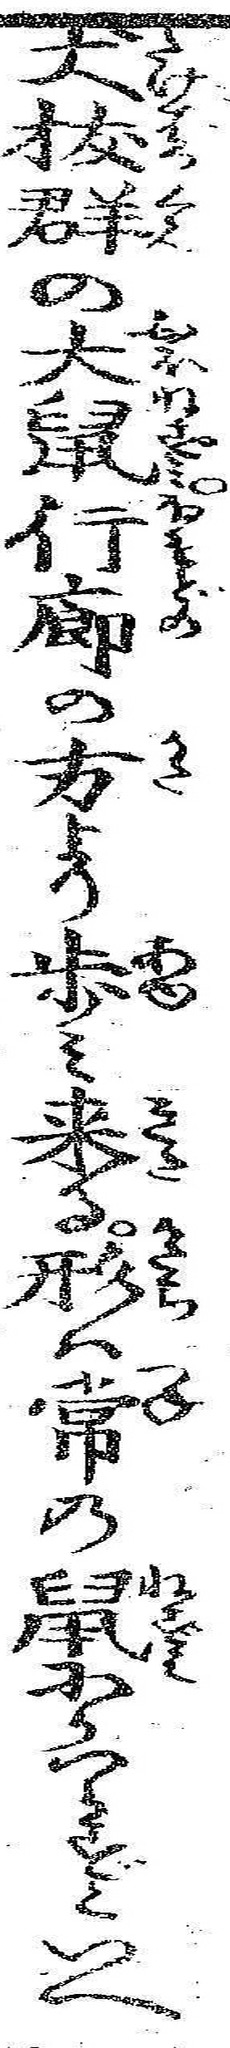丈抜群の大鼠。行廊の方より歩み来る。形は常の鼠にかはらずといへ
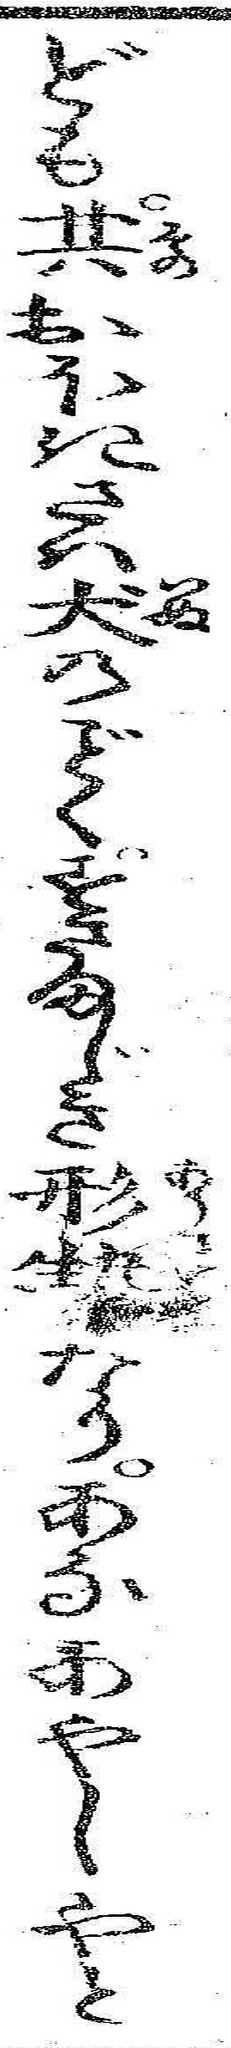ども。其おほきさは犬のごとく。すさまじき形勢なり。あなあやしやと
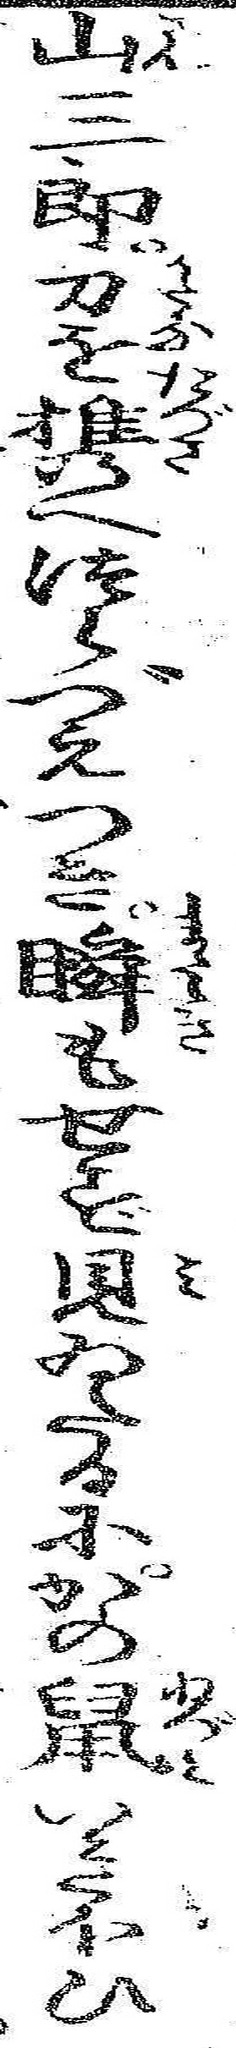山三郎。刀を携へつらづえつき。瞬もせず見ゐたるに。かの鼠いきほひ
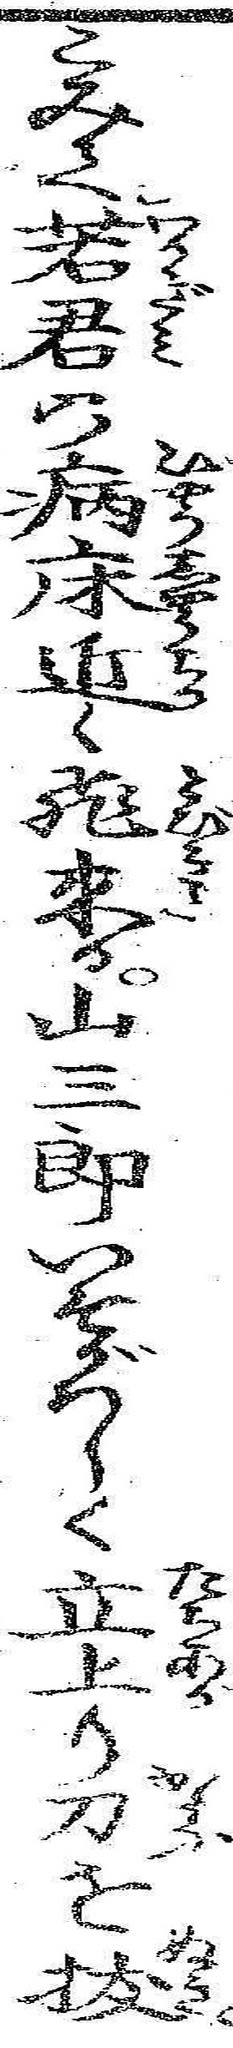こみて。若君の病床近く飛来る。山三郎いそがはしく立上り刀を抜。
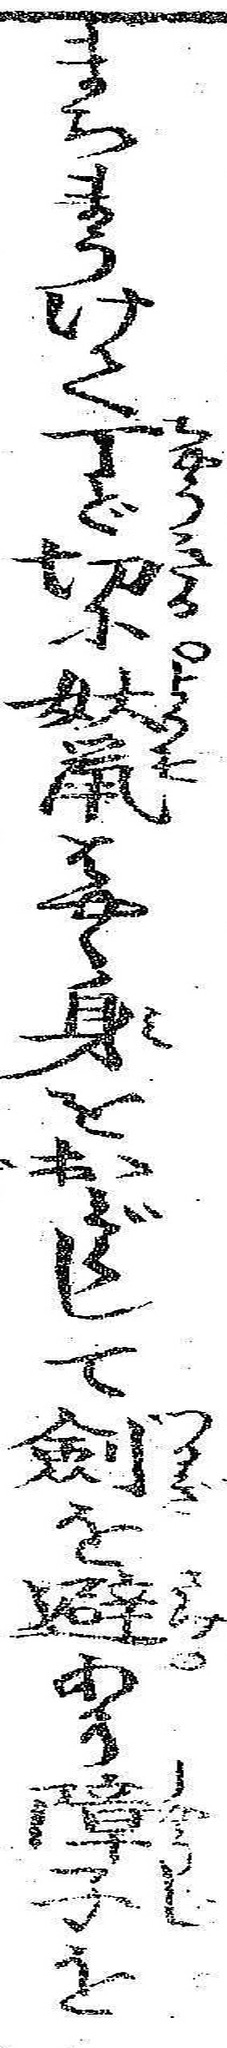まちまうけて丁ど切に。妖鼠はやく身をおどらして剣を避。あかり障子を
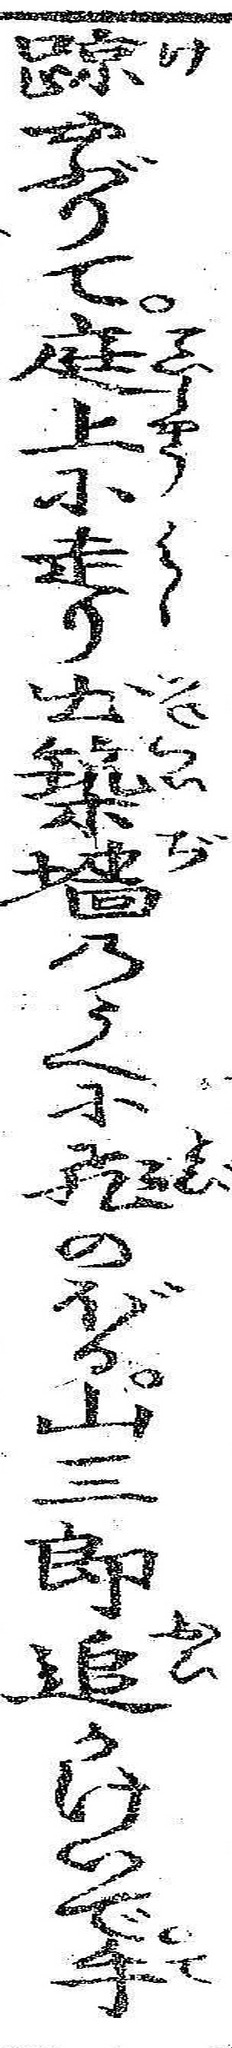蹴やぶりて。庭上に走り出築墻のうへに飛のぼる。山三郎追かけいで。手
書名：昔話稲妻表紙
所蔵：国文学研究資料館
